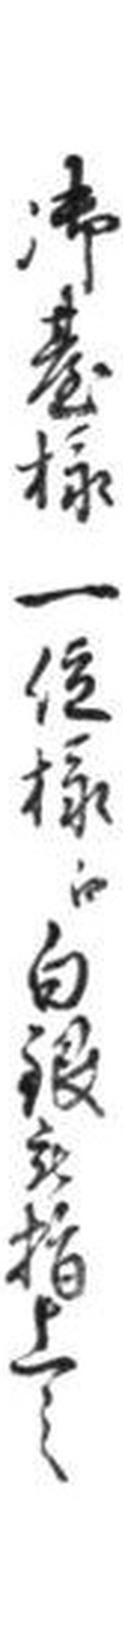御台様一位様江白銀被指上之
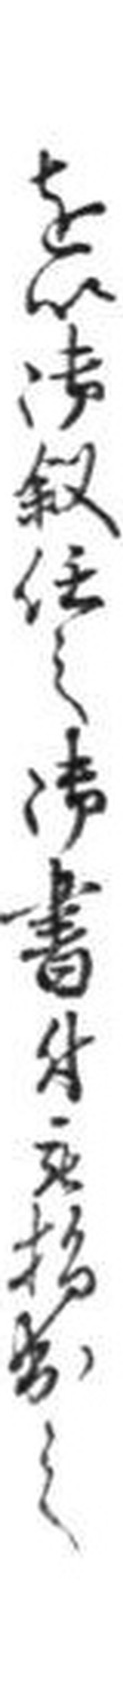を以御叙任之御書付被指出之
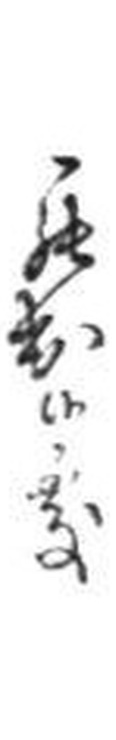罷出候処
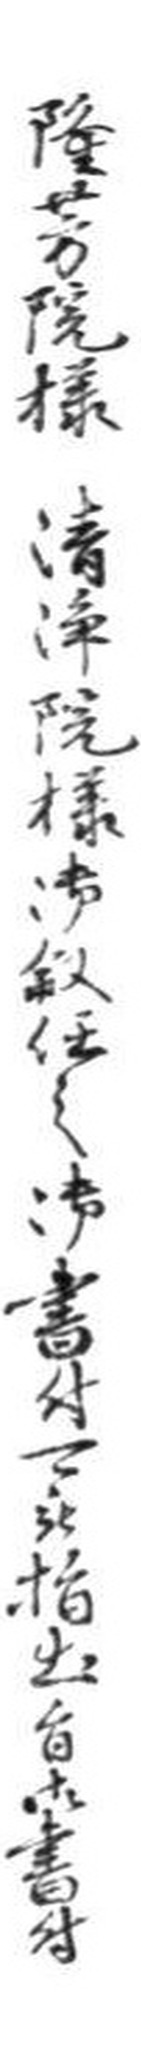隆芳院様清浄院様御叙任之御書付可被指出旨御書付
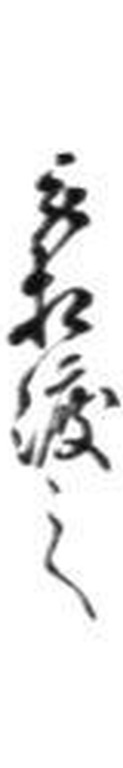被相渡之
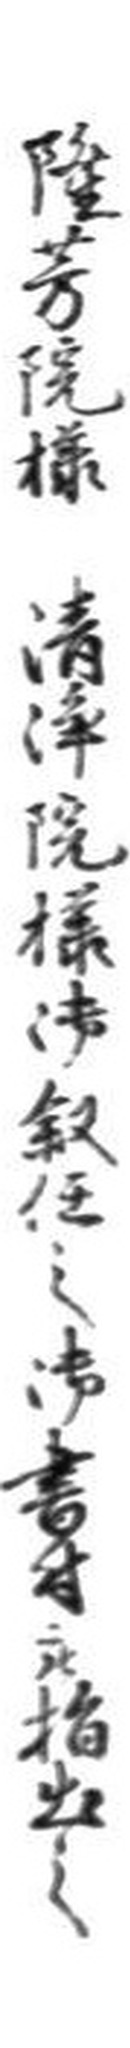隆芳院様清浄院様御叙任之御書付被指出之
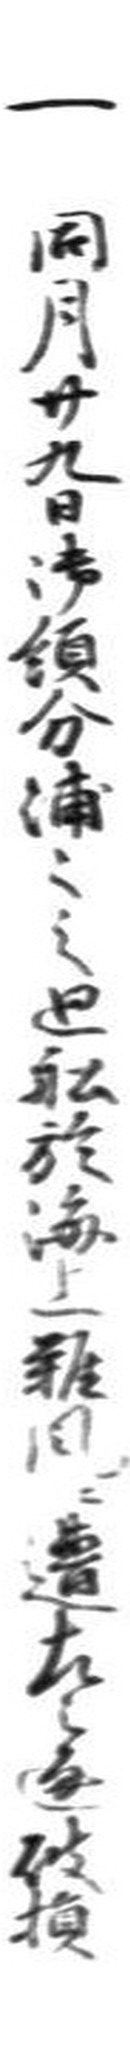一同月廿九日御領分浦々之廻船於海上難風ニ遭左之通破損
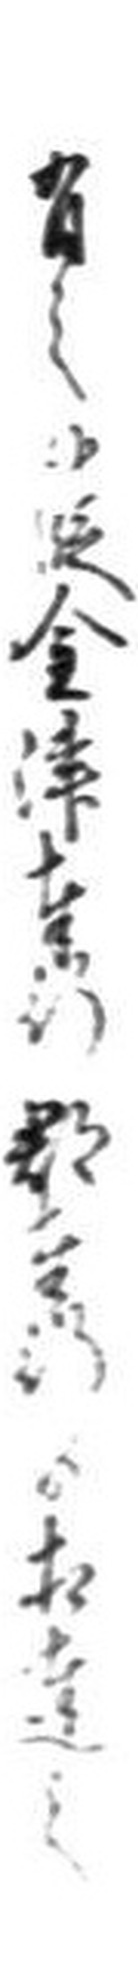有之候段金津奉行郡奉行ゟ相達之
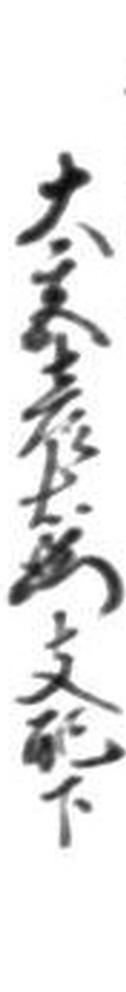大宮彦右衛門支配下
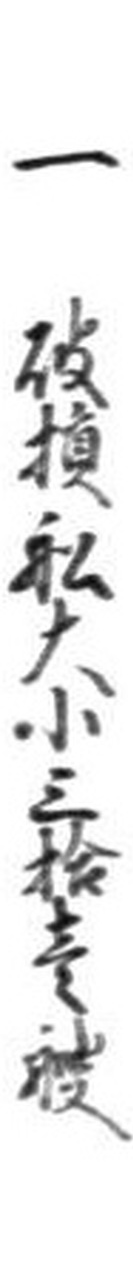一破損船大小三拾壱艘

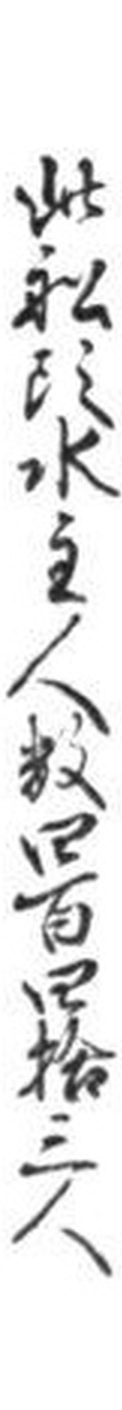此船頭水主人数四百四拾三人
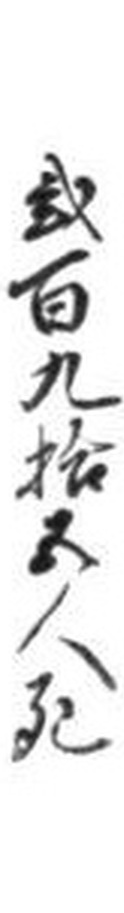内弐百九拾五人死
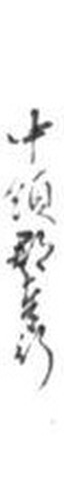中領郡奉行
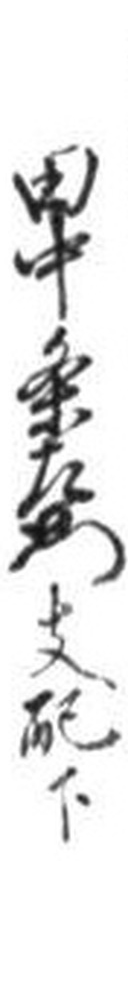田中条左衛門支配下
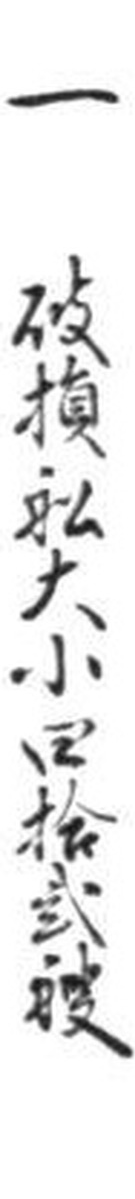一破損船大小四拾弐艘
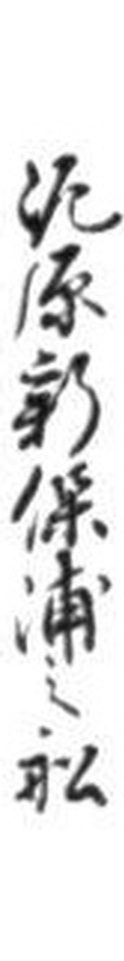壱艘新保浦之船
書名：家譜 二十二 吉品公 従元禄十五年到同十六年
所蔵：福井県文書館 Fukui Prefectural Archives
